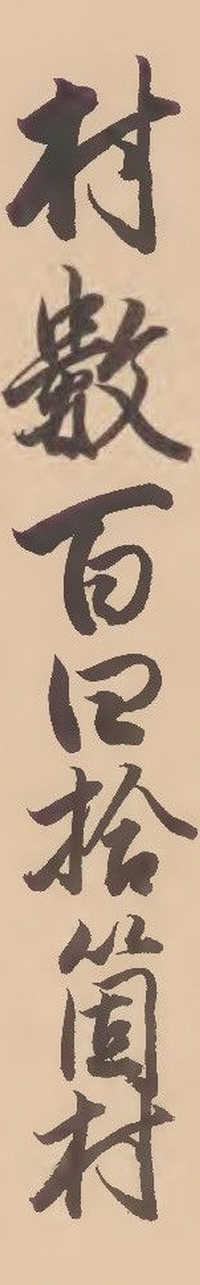村数百四拾箇村
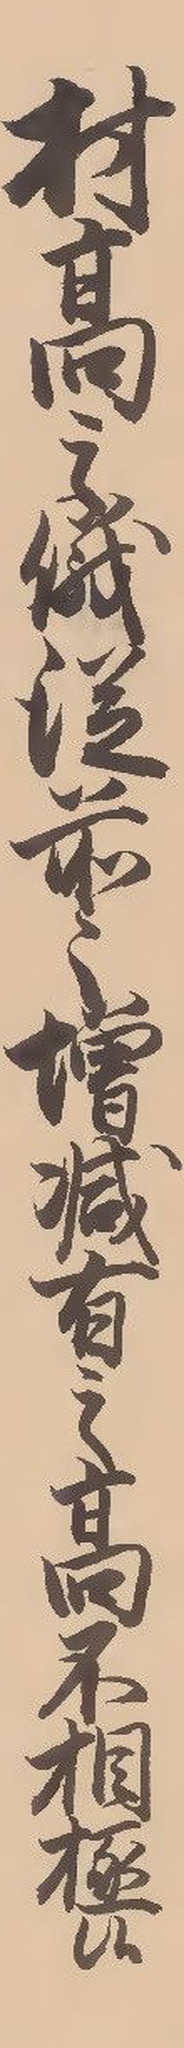村高之俄従前々増減有之高不相極候
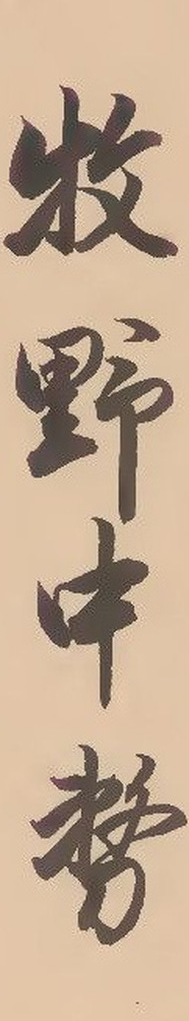牧野中務
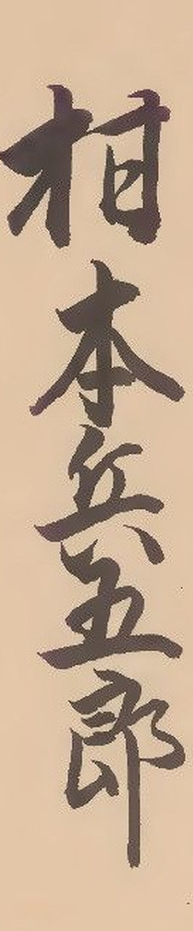柑本兵五郎
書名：対馬国郷帳
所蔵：国立公文書館 National Archives of Japan
